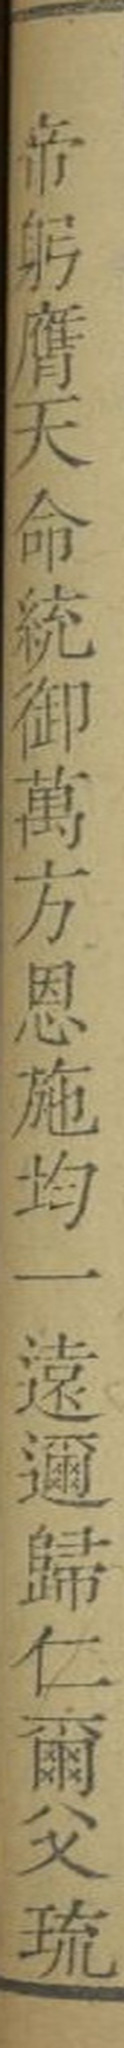帝躬膺天命統御万方恩施均一遠邇帰仁爾父琉
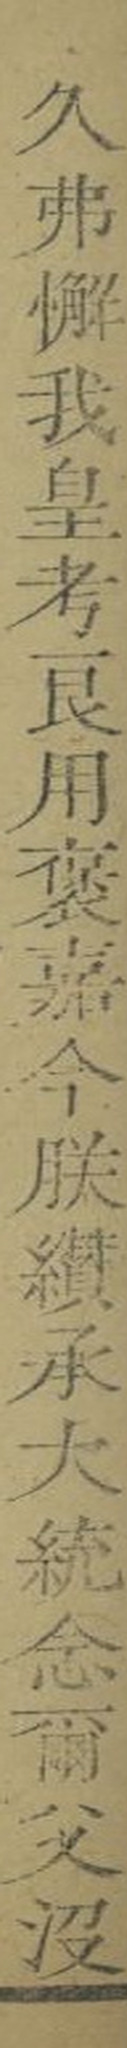久弗懈我皇考良用褒嘉今朕纘承大統念爾父没
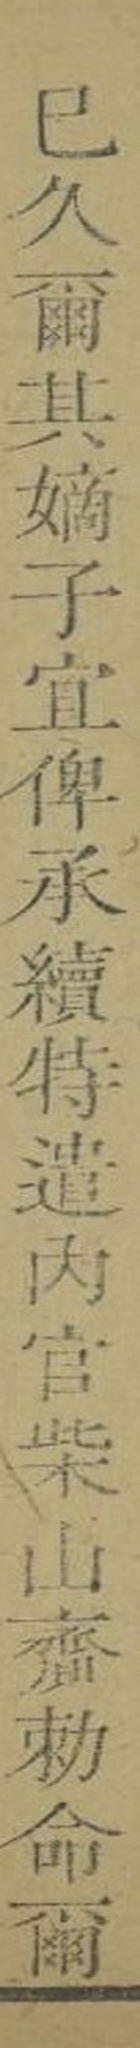巳久爾其嫡子宜俾承続特遣内官柴山齎勅命爾
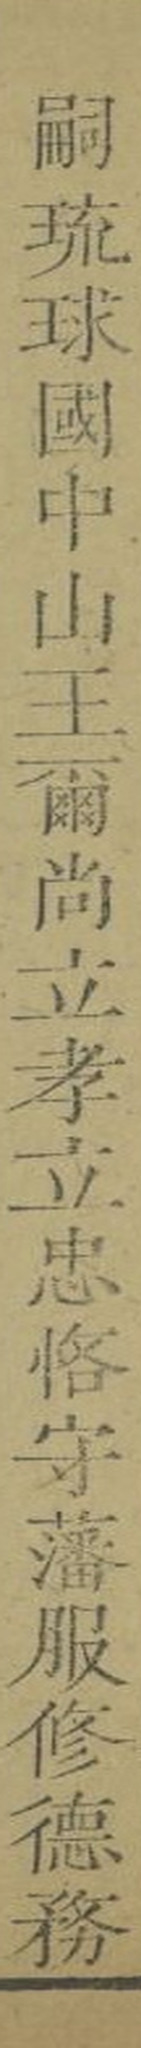嗣琉球国中山王爾尚立孝立忠恪守藩服修徳務
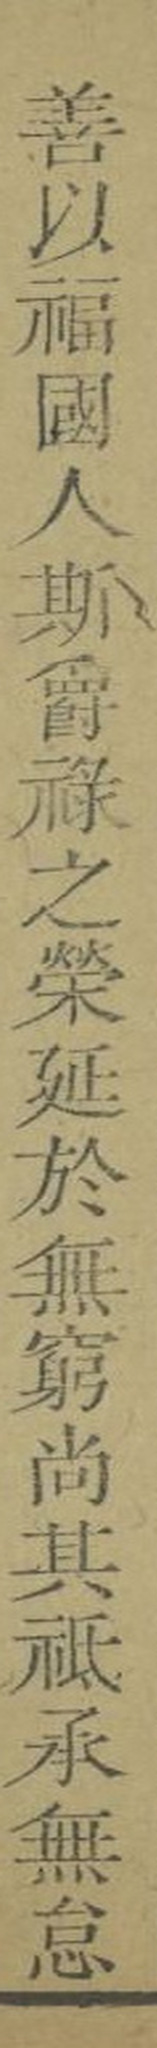善以福国人斯爵禄之栄延於無窮尚其祇承無怠
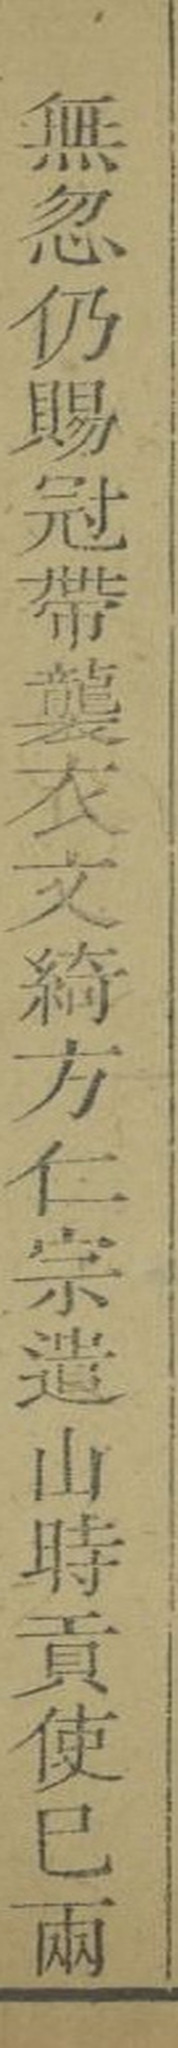無忽仍賜冠帯襲衣文綺方仁宗遣山時貢使巳両
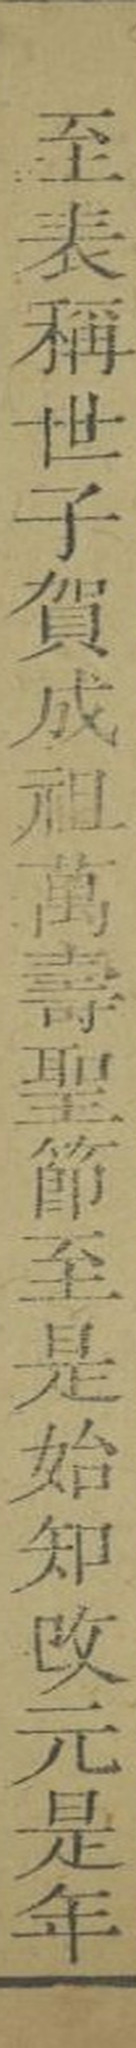至表称世子賀成祖万寿聖節至是始知改元是年
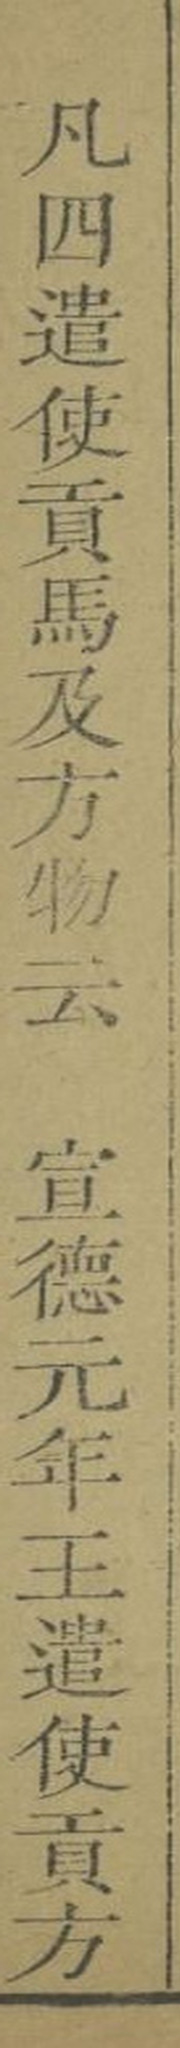凡四遣使貢馬及方物云宣徳元年王遣使貢方
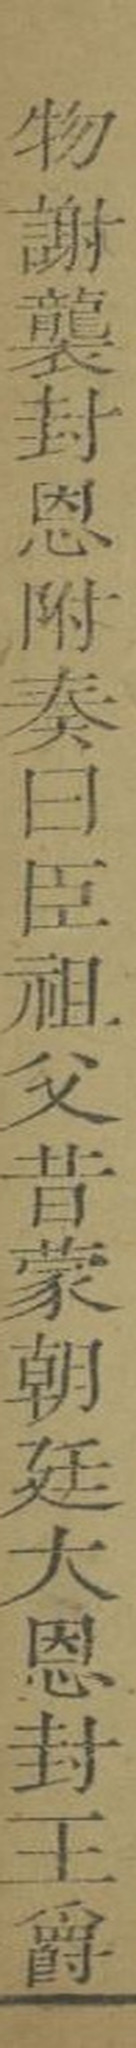物謝襲封恩附奏曰臣祖父昔蒙朝廷大恩封王爵

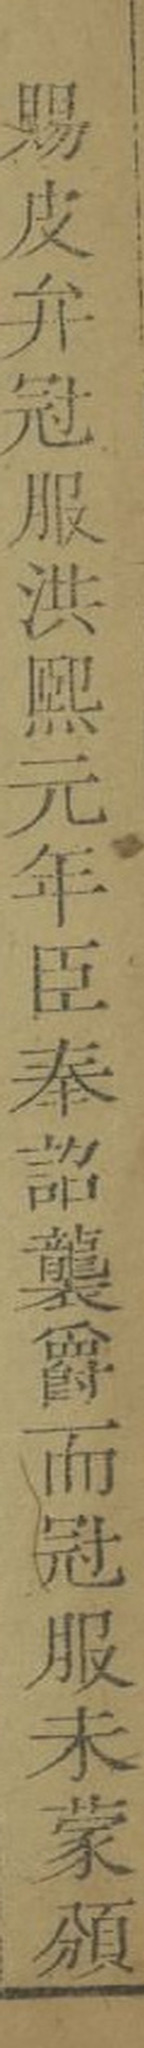賜皮弁冠服洪熙元年臣奉詔襲爵而冠服未蒙頒
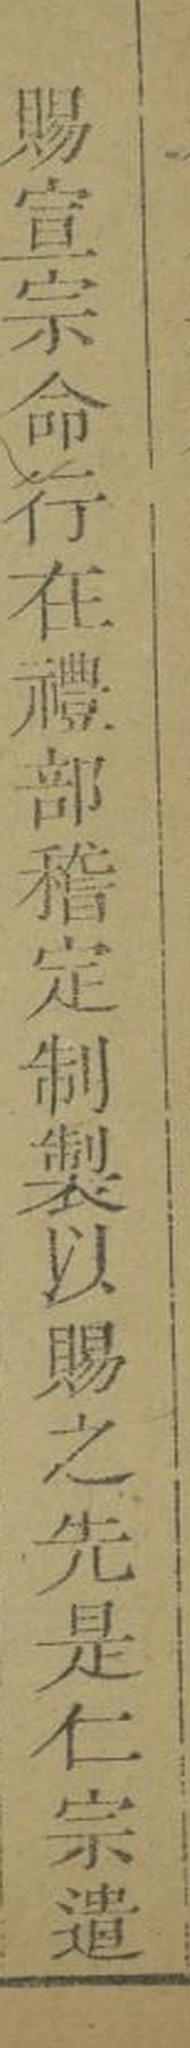賜宣宗命行在礼部稽定制製以賜之先是仁宗遣
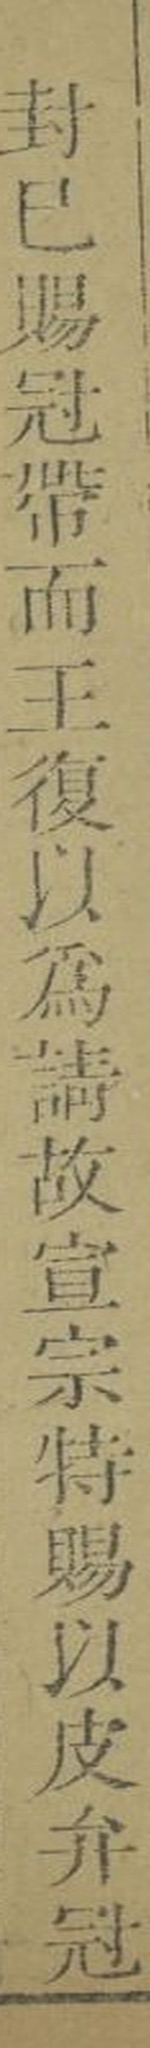封巳賜冠帯而王復以為請故宣宗特賜以皮弁冠
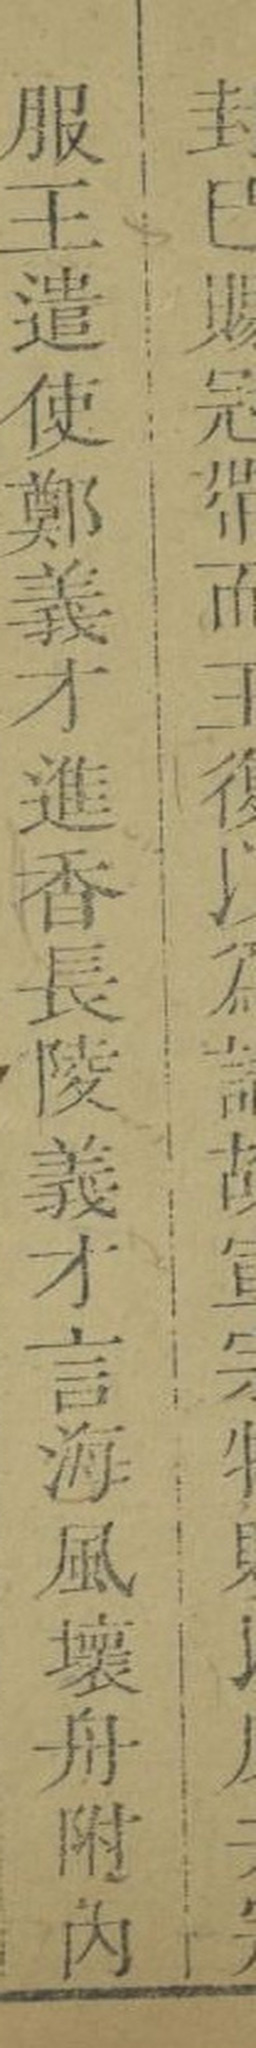服王遣使鄭義才進香長陵義才言海風壊舟附内
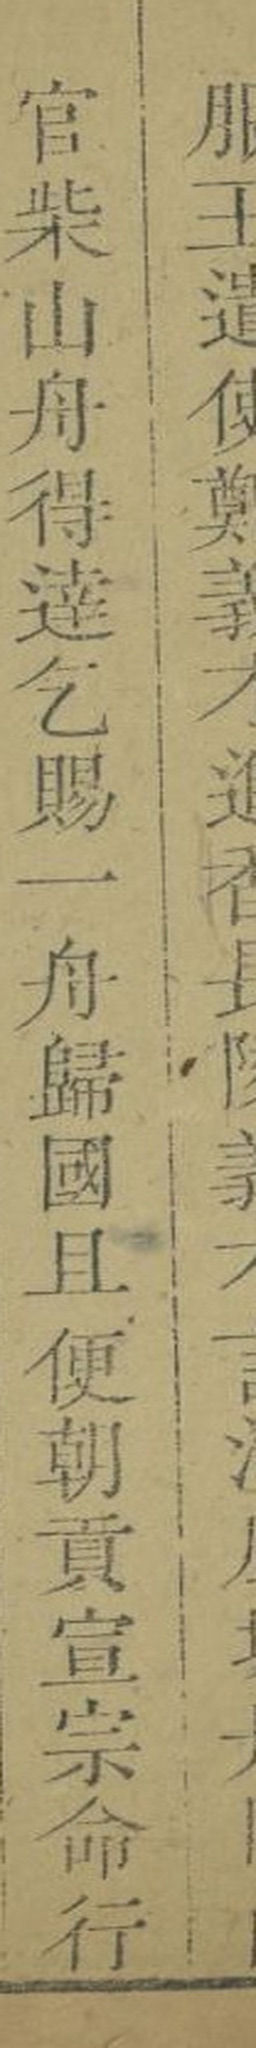官柴山舟得達乞賜一舟帰国且便朝貢宣宗命行
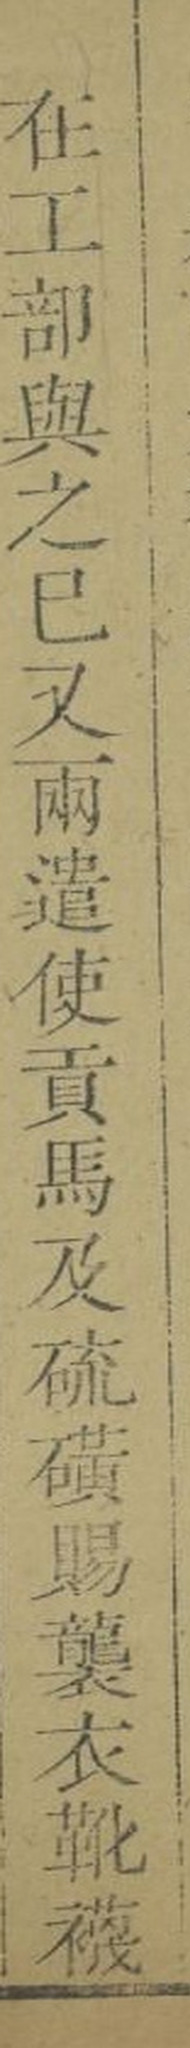在工部与之巳又両遣使貢馬及硫磺賜襲衣靴襪
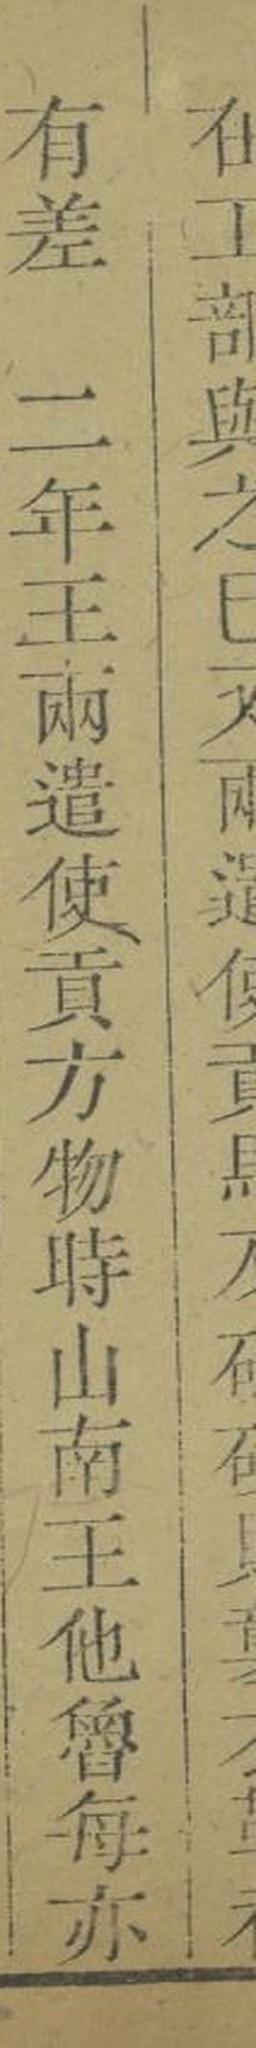有差二年王両遣使貢方物時山南王他魯毎亦
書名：中山伝信録 巻三
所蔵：University of the Ryukyus Library
